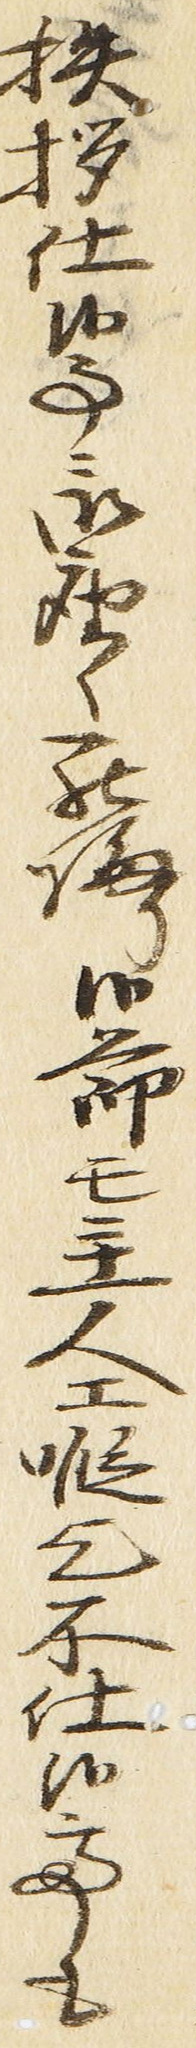挨拶仕候事に御座候罷帰り候節も主人え暇乞不仕候ても
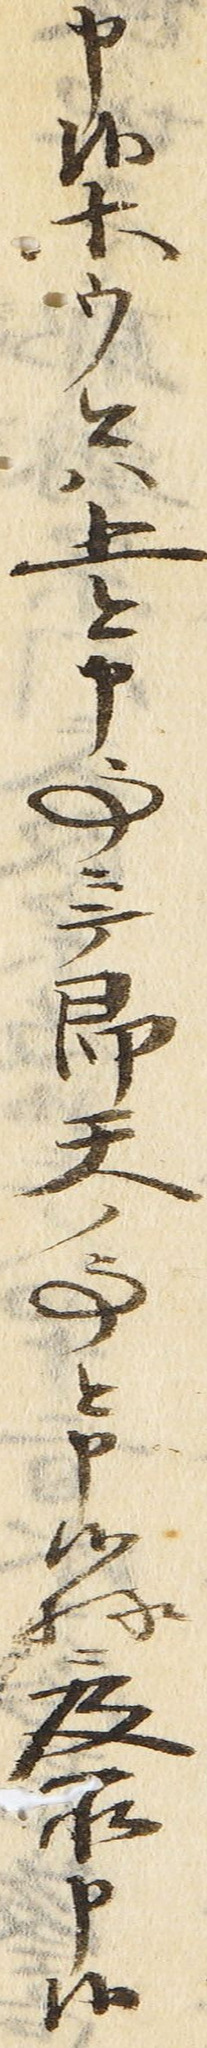申候ホウとは上と申事にて即天の事と申候様に及承申候
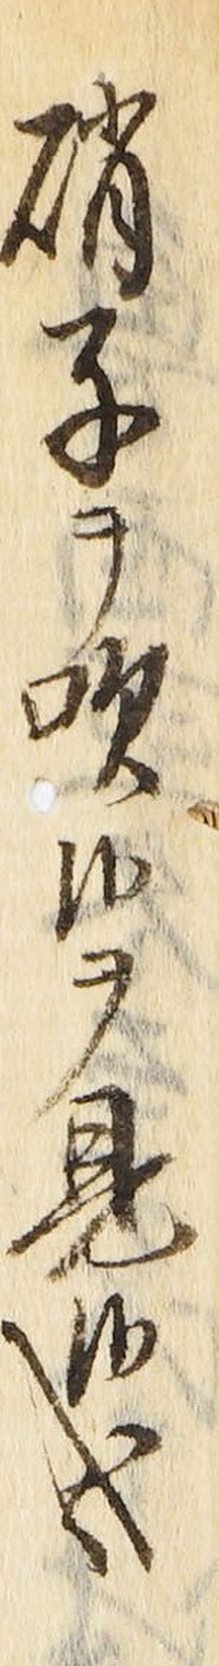硝子を吹候を見候哉
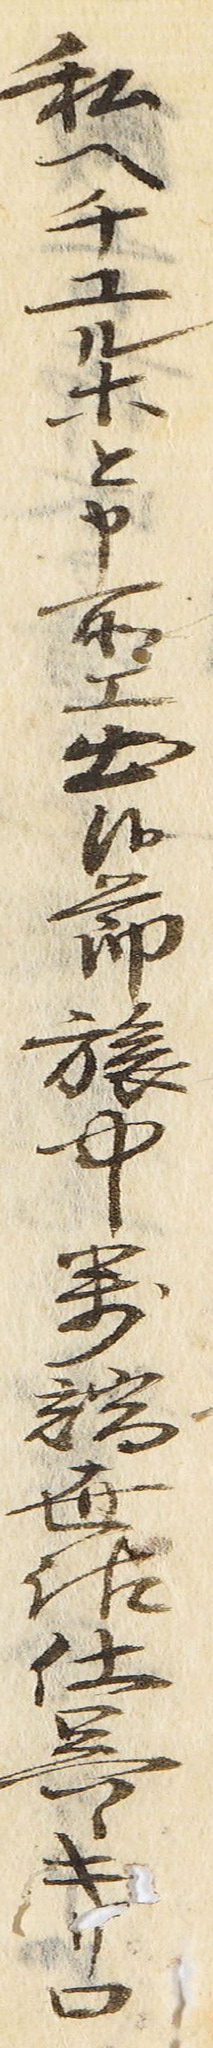私ヘチユルホと申所え出候節旅中万端世話仕呉候キリロ
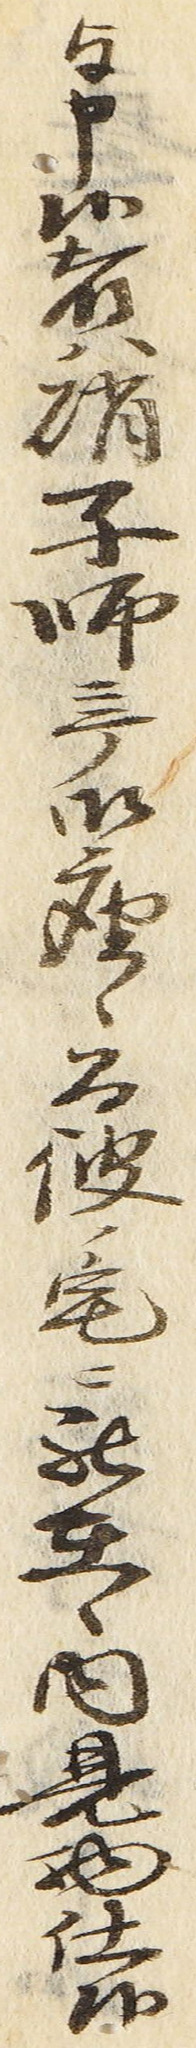と申候者は硝子師にて御座候間彼の宅に罷在候内見物仕候
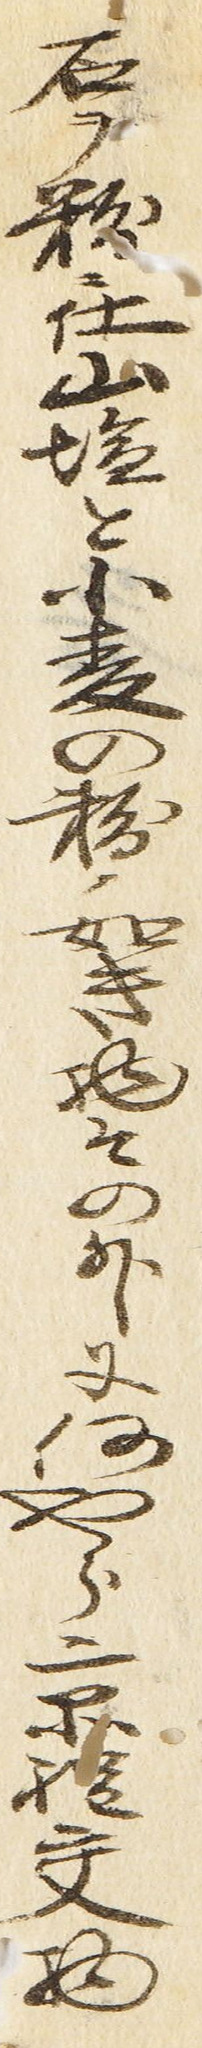石を粉に仕山塩と小麦の粉の如き物その外に何やら二品程交物
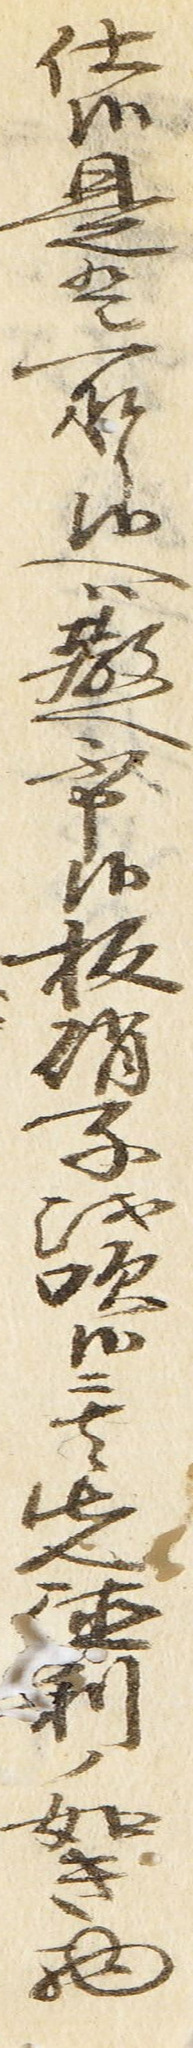仕候是は承り候へは教へ不申候板硝子を吹候には先徳利の如き物
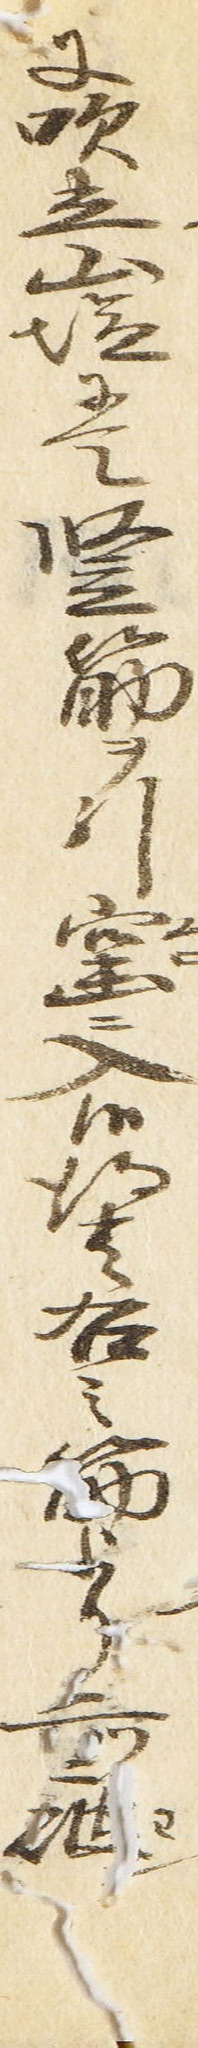に吹立山塩にて竪筋を引室に入候得は右之筋より二ツに破
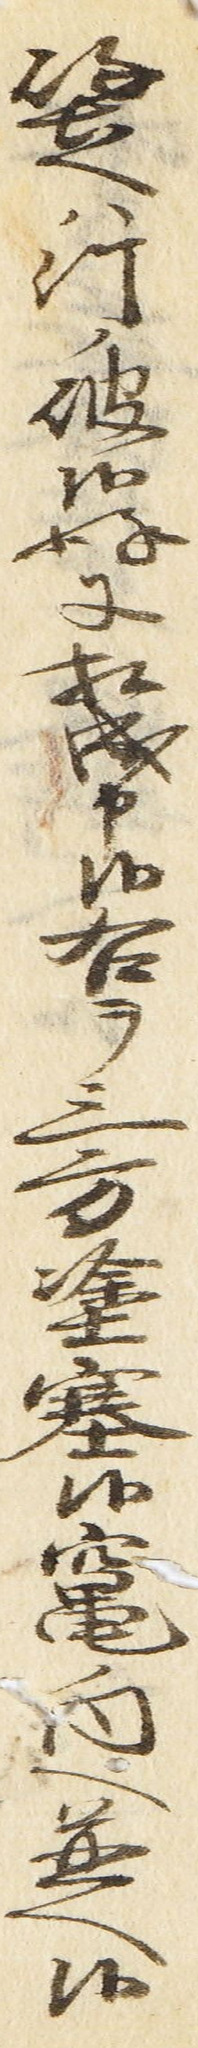壁へは竹の破候様に相成申候右を三方塗塞候竈の内へ並へ候
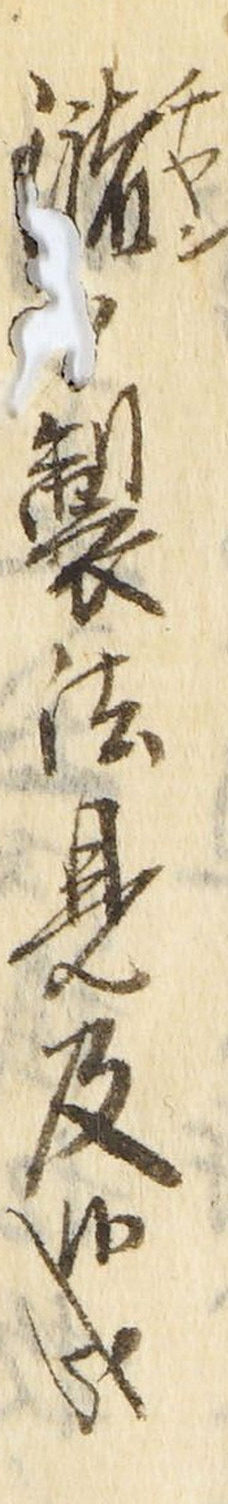㶆の製法見及候哉

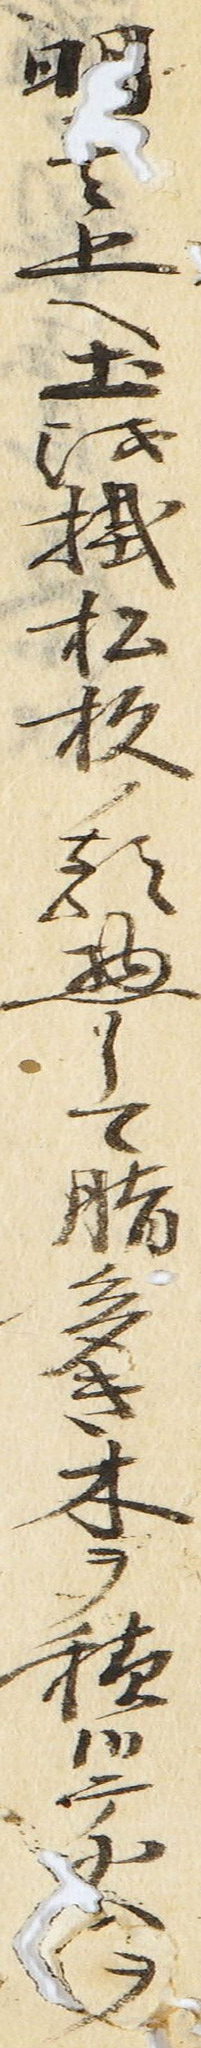明其上へ土を掛松杉の類惣して脂多き木を積候て火を
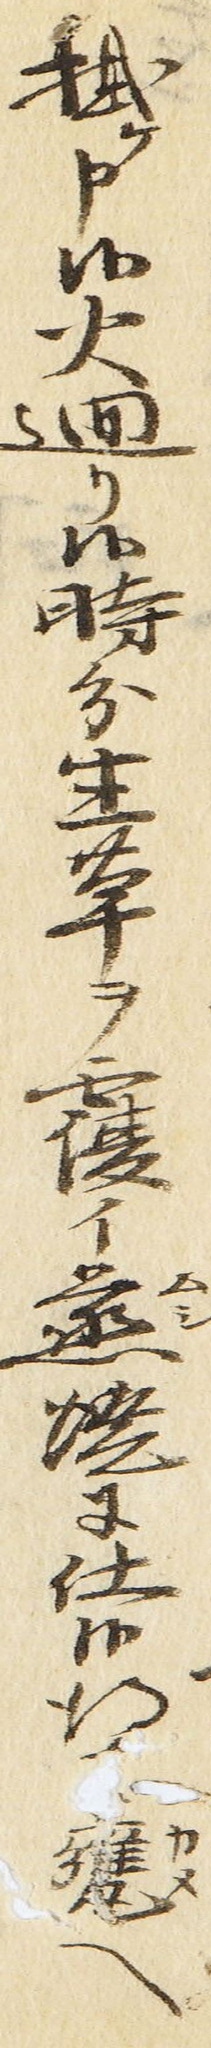掛け申候火廻り候時分生草を覆い蒸焼に仕候得は甕へ
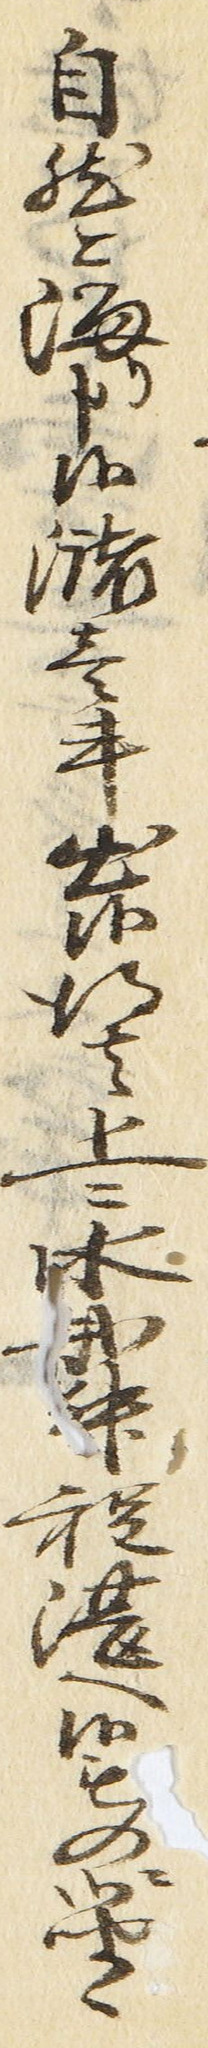自然と溜り申候㶆壱斗出候得は上に水弐升程湛へ候ものに御座候
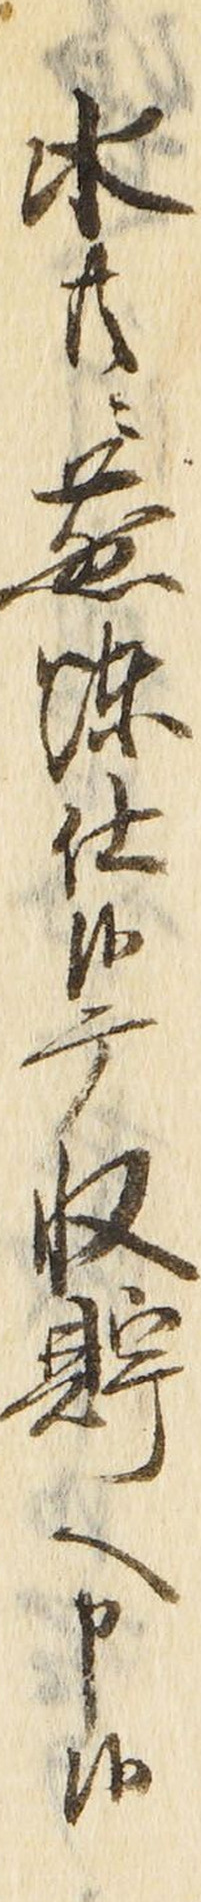水共に蒸煉仕候て収貯へ申候
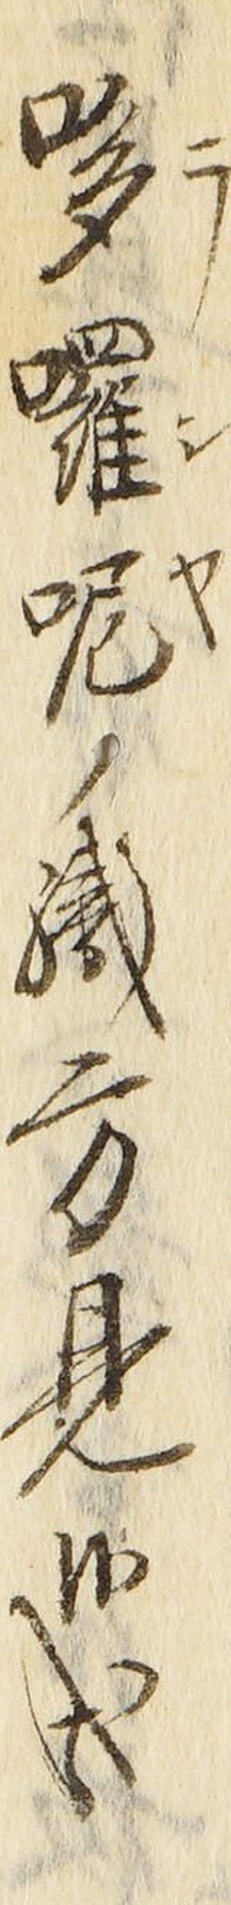多羅呢の織方見候哉
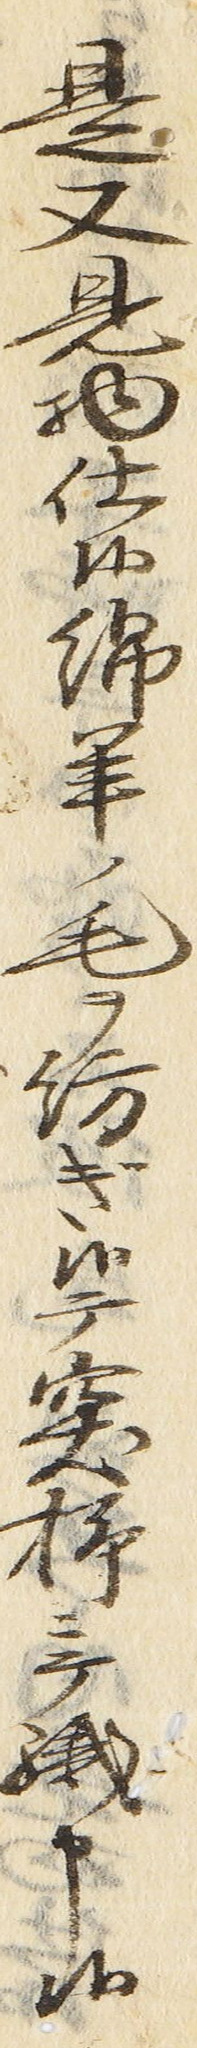是又見物仕候綿羊の毛を紡ぎ候て突杼にて織申候
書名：神昌丸漂流問答
